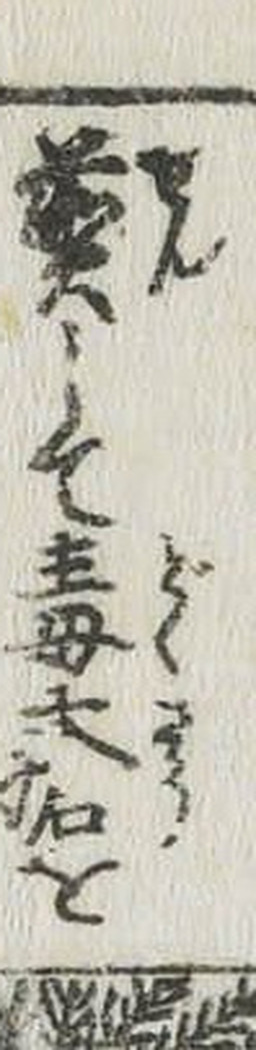煎して毒瘡を
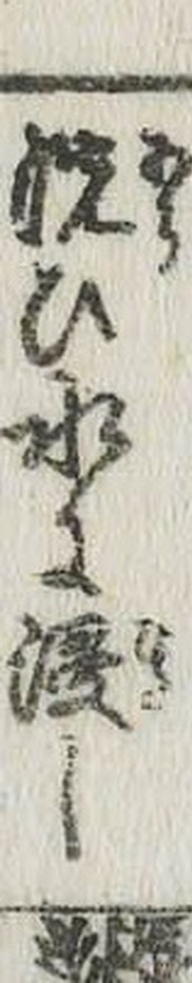洗ひ水に浸し
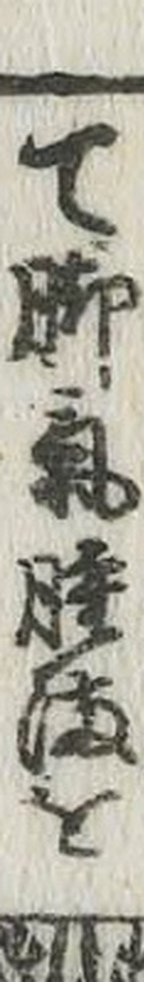て脚気腫満を
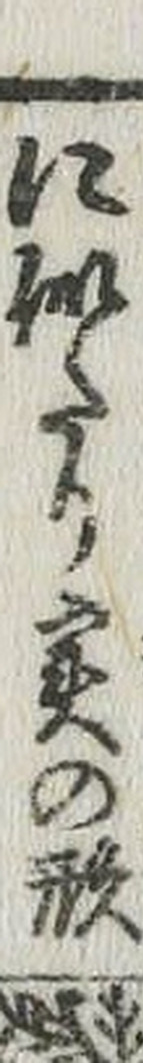に似たり実の形
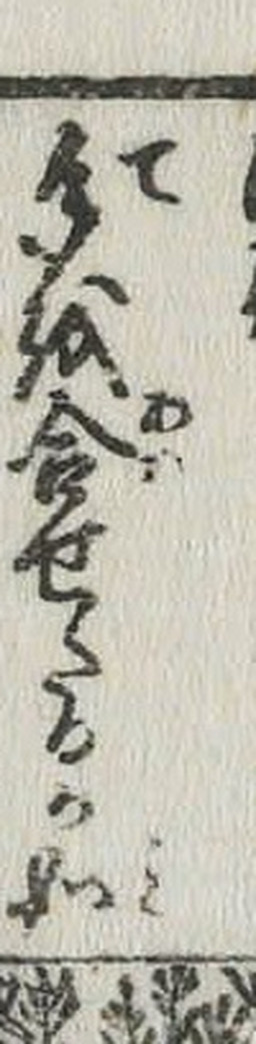手を合せたるか如し
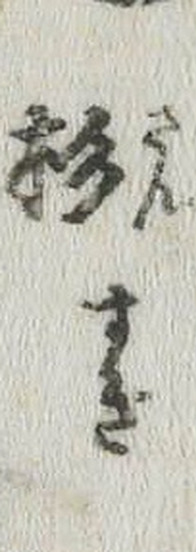杉すぎ

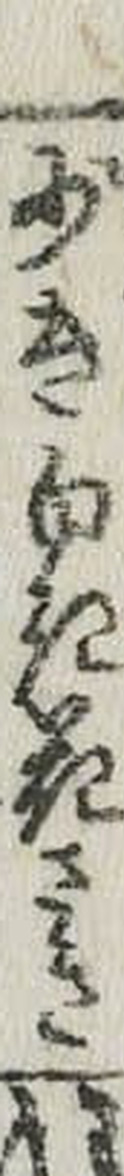少き白き花さき
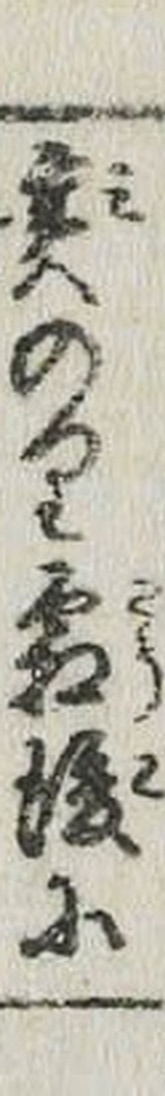実のり霜後に
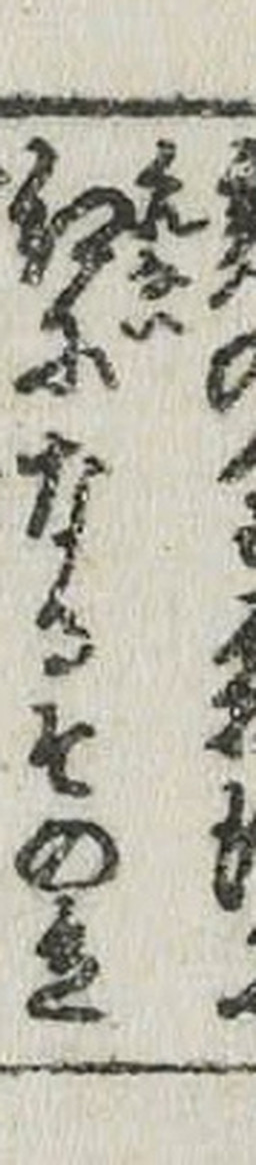紅になるその色
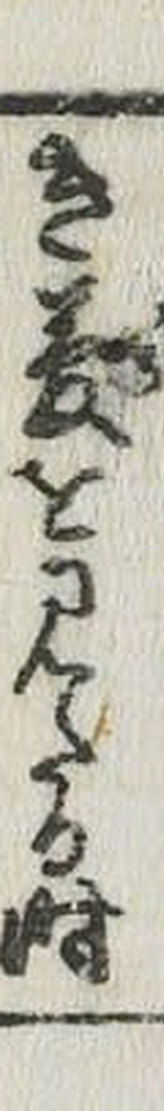き夢を見たる時
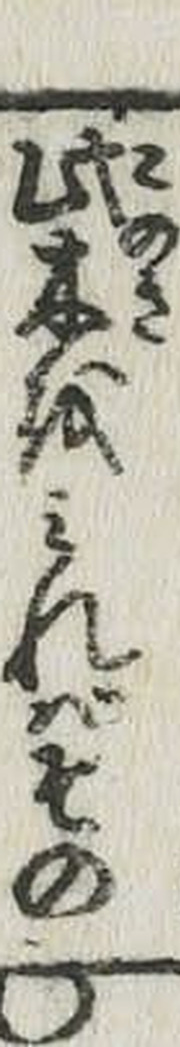此木をみればその
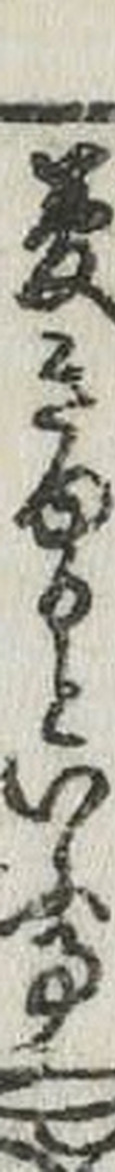夢きゆるといふ事
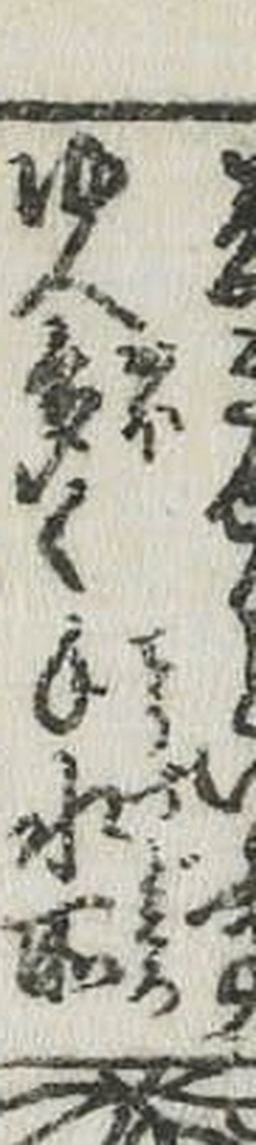ゆへ多く手水所
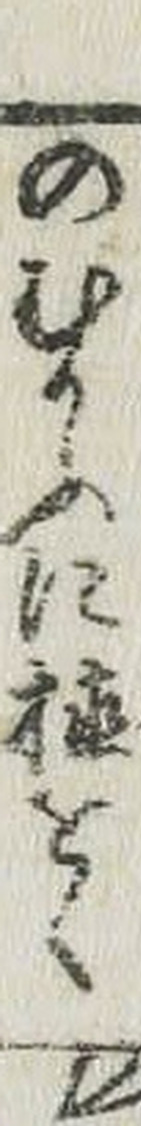のむかふに植をく
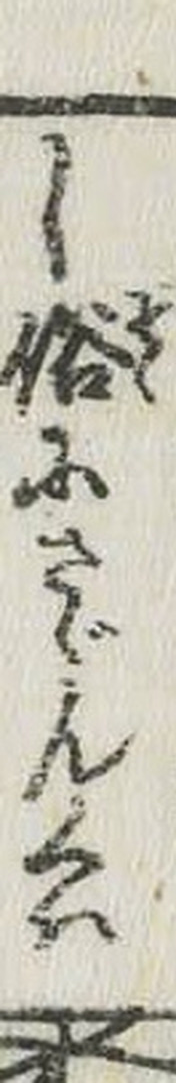し俗にさゞんくは
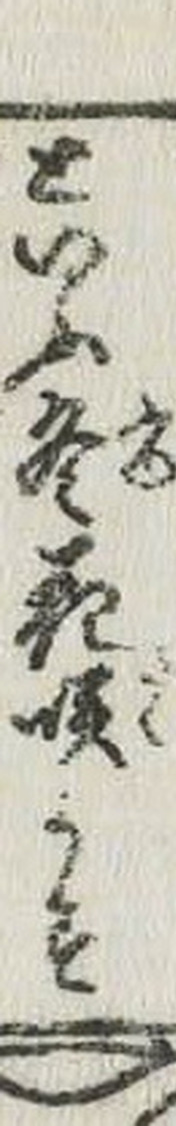といふ冬花咲うす
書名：増補頭書訓蒙図彙大成 10巻 8:巻之17-19
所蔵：東京学芸大学教育コンテンツアーカイブ
